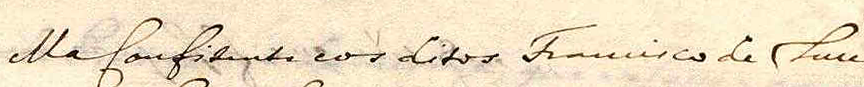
ella Confitente e os ditos Francisco de Luce
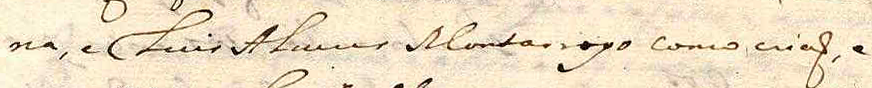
na, e Luis Alueres Montarroyo como criaõ, e
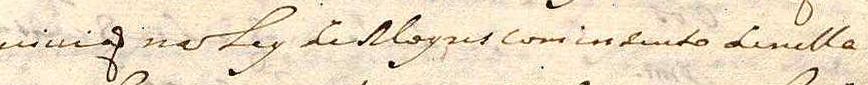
uiuiaõ na Ley de Moyzes com intento de nella
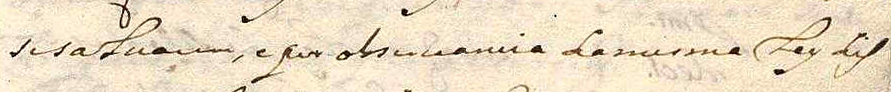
se saluarem, e por obseruancia da mesma Ley dis
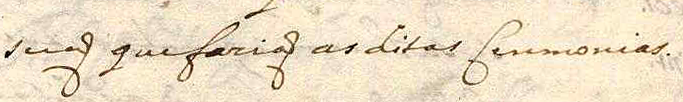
seraõ que faziaõ as ditas Ceremonias.
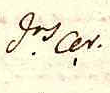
d.as cer.
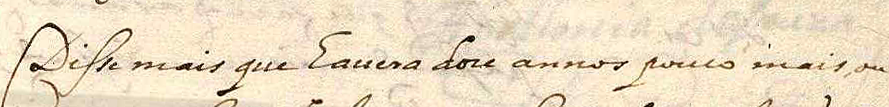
Disse mais que hauera doze annos pouco mais, ou
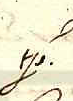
tp.o
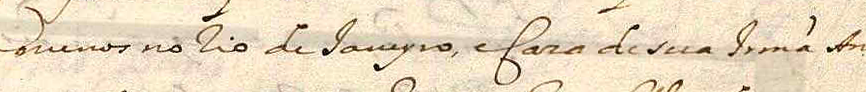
menos no Rio de Ianeyro, e Caza de sua Irmã An
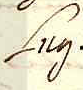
Lug.
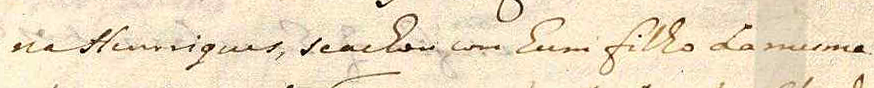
na Henrriques, se achou com hum filho da mesma
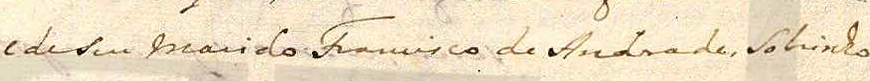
e de seu marido Francisco de Andrade sobrinho
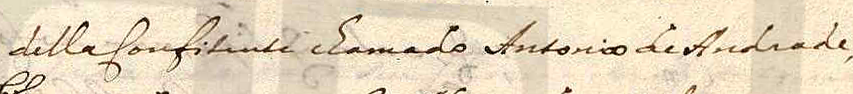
della Confitente chamado Antonio de Andrade,
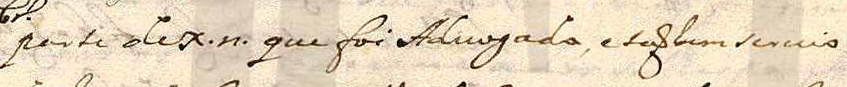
parte de x. n. que foi Aduogado, e taõbem seruio
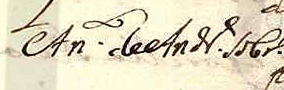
An.to de Andr.e sobr.o
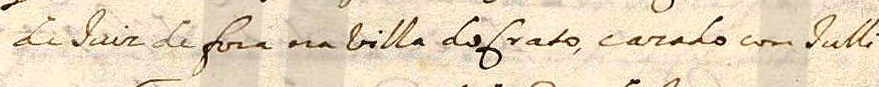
de Iuiz de fora na villa do Crato, cazado com Iulli
